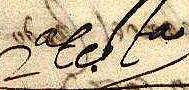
2a testa
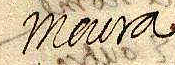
moura
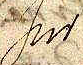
Jur
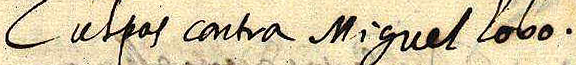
Culpas contra Miguel Lobo
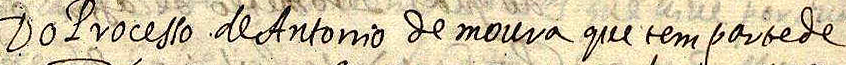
Do Processo de Antonio de moura que tem parte de
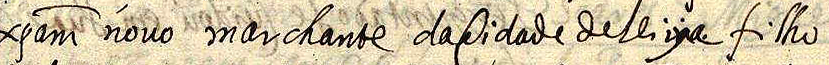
xpām nouo marchante da Cidade de Leirya filho
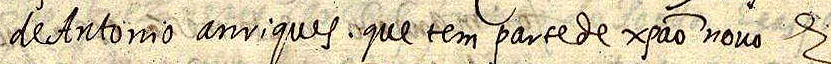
de Antonio anriques. que tem parte de xpão nouo E
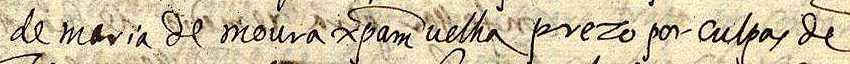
de maria de moura xp̄am uelha prezo por culpas de
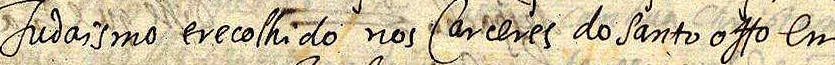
Judaismo e recolhido nos Carceres do Santo offo em
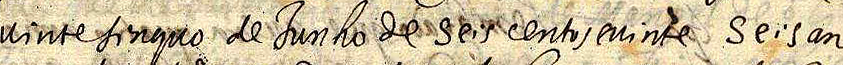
uinte sinquo de Junho de Seiscentos e uinte Seis an
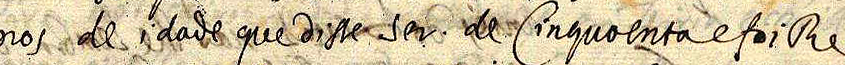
nos de idade que disse ser. de Cinquoenta e foi Re
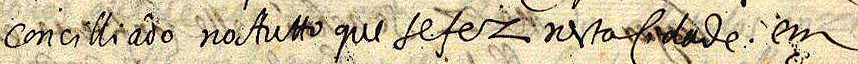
concilliado no Autto que se fez nesta Cidade. em
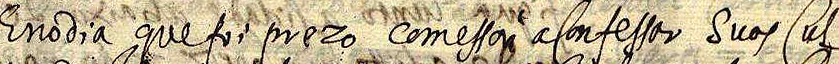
E no dia que foi prezo comessou Confessar Suas CuL
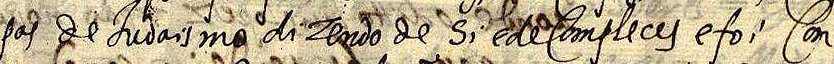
pas de Judaismo dizendo de Si e de Compleces e foi Con
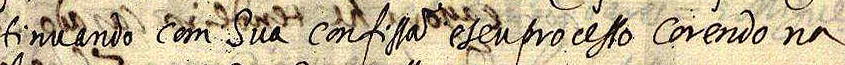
tinuando com Sua confissaõ e seu processo corendo na
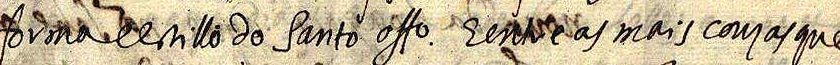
forma e estillo do Santo offo. E entre as mais couzas que
